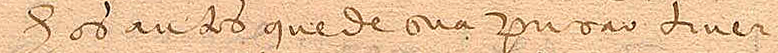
hos autos que de sua prisão tiuer
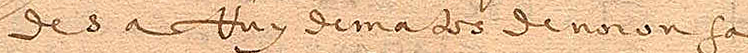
des a Ruy de matos de noronha
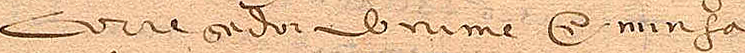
Corregedor do crime ē minha
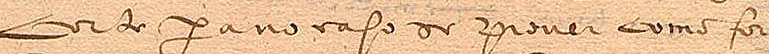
Corte ꝑa no caso se prouer como for
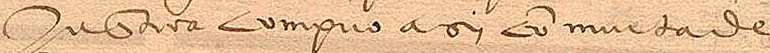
Justiça comprio asy cō muita de
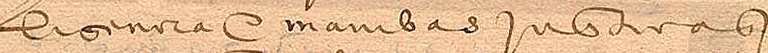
ligencia e mando as justiças
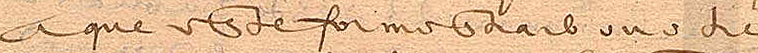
a que este for mostrado ou o tre
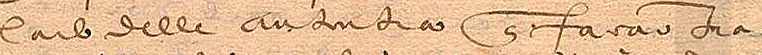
lado delle autentico q̄ façaõ tra
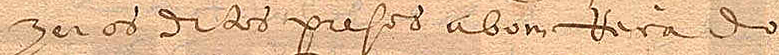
zer os ditos presos a bom Recado
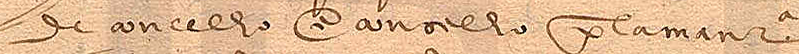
de concelho ē conselho p̄la manra
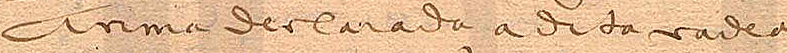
Acima declarada a dita cadea
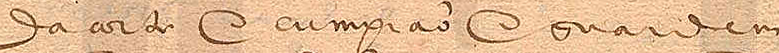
da corte e cumpraõ e guardem
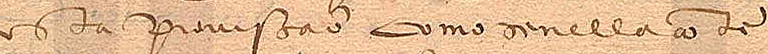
esta prouissaõ como se nella c̄otē
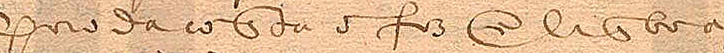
pero da costa o fez ē lisboa
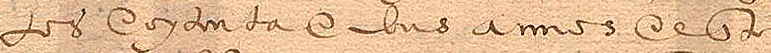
tos e oytenta e dous annos e este
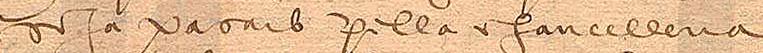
seJa pasado pella chancellaria
